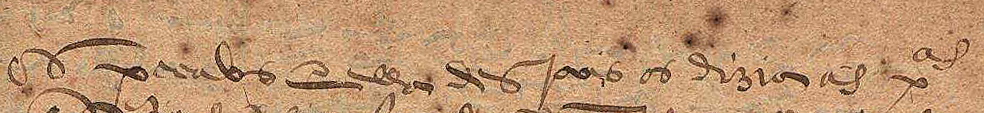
os pecados e ella despois os dizia as pas
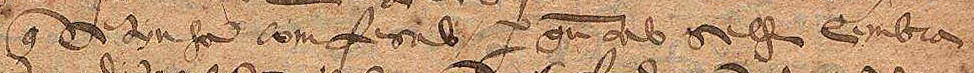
q̄ se tynhā comfesado / ꝑḡutado se lhe lembra
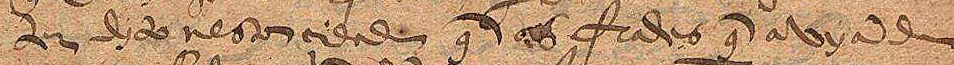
ter dyto nesta cidade q̅ os frades q̅ avya̅ de
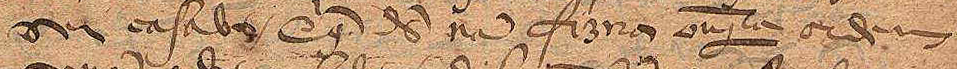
ser casados / e q̅ ds̄ nā fizera outra ordem
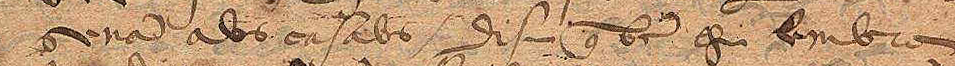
senā a dos casados / dise q̅ be̅ lhe lembra
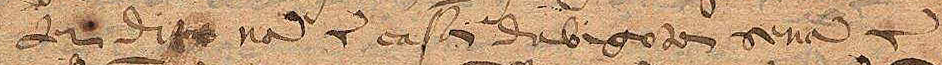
ter dito na̅ e̅ casa dabigota sena̅ ē
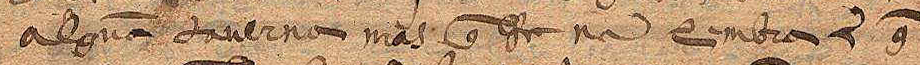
algūa tauerna mas q̅ lhe na̅ lembra e̅ q̅
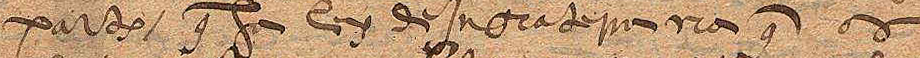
partꝭ / q̄ he ley de Jngraterra era q̅ os
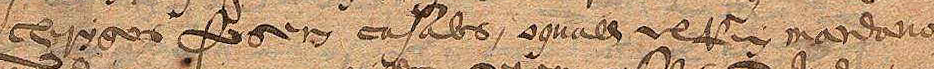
clerygos fosem casados / o quall el Rey mandaua
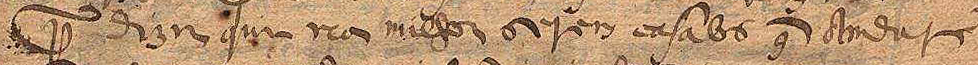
p̄o dizer que era milhor serem casados q̄ Amdarē
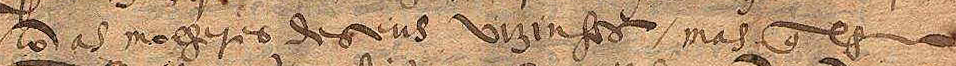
cō as molheres de seus vizinhos / mas q̄ lhe
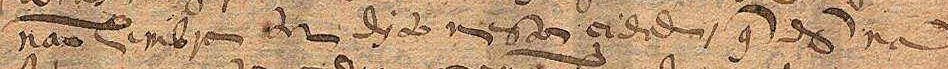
não lembra ter dyto nesta cidade / q̅ ds̄ na̅
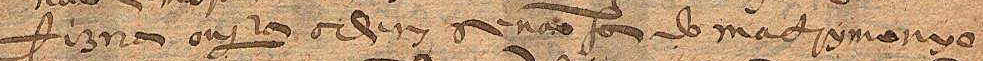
fizera outra ordem senão ho do matrymonyo
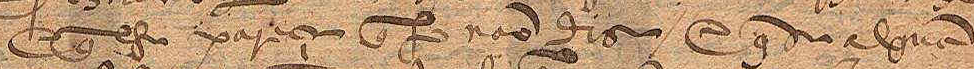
e q̅ lhe parece q̅ ho não dise / e q̅ se algūa
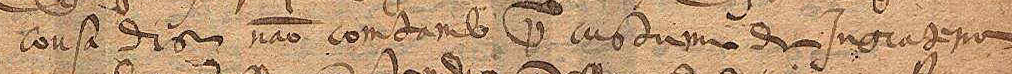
cousa dise não comtamdo p̄o custume de Jngraterra
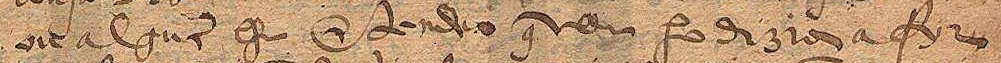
ou alguē lhe ētemdeo q̄ elle ho dizia afyr
